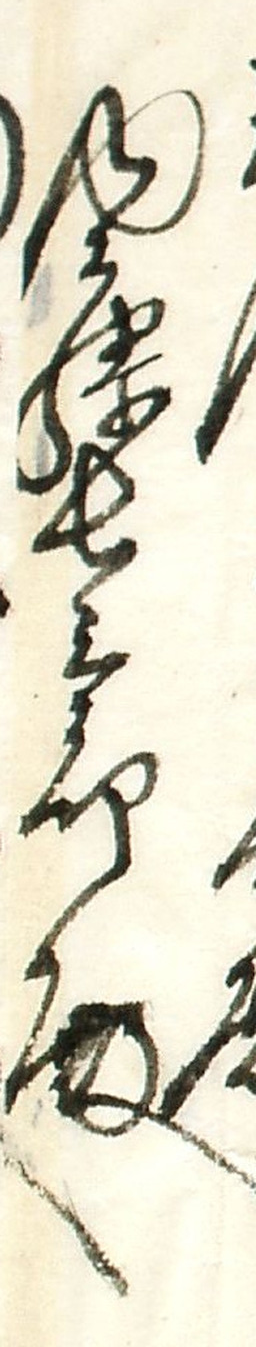内藤長三郎殿
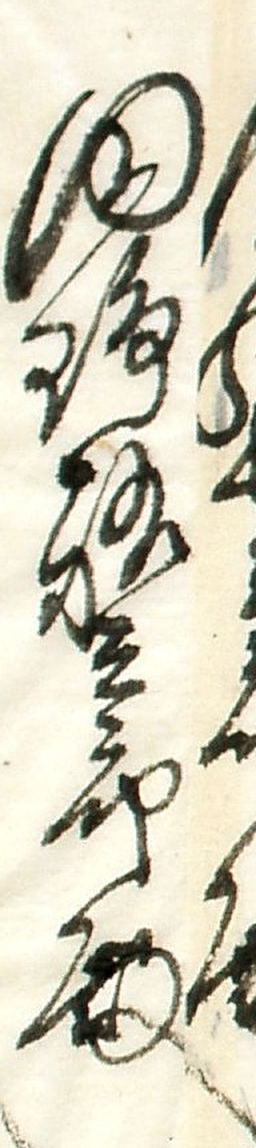田端祐太郎殿
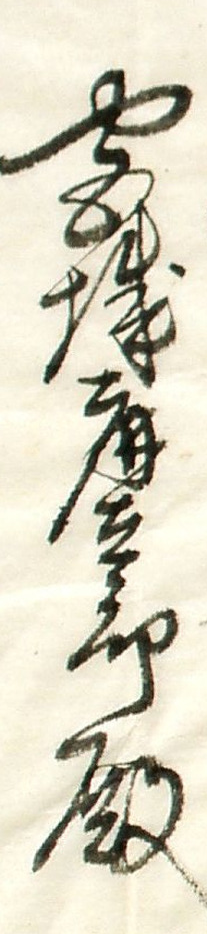宮城麻太郎殿
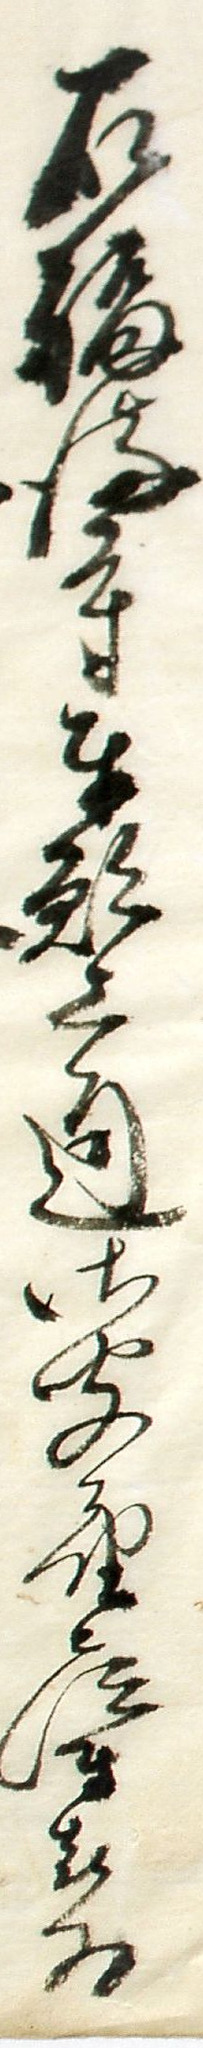右福満寺奉願上通御聞届被仰付被為
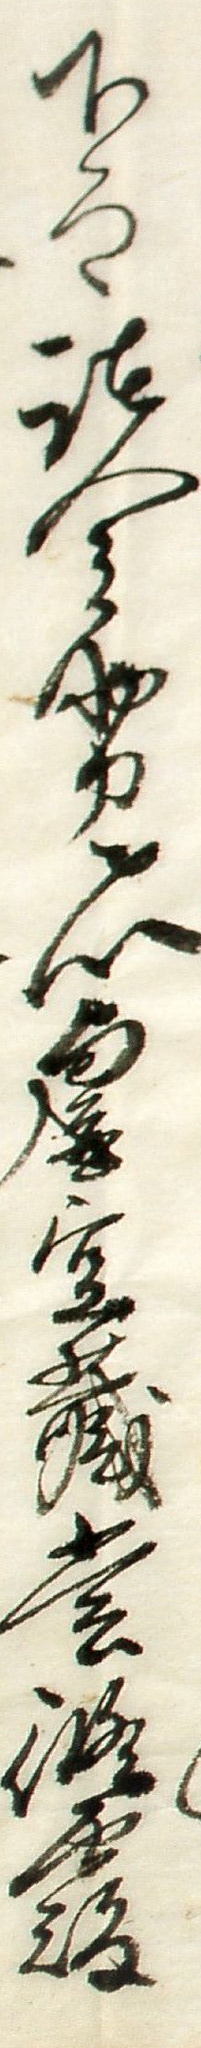下候ハヽ諸人之助力ヲ以虚空蔵堂修覆
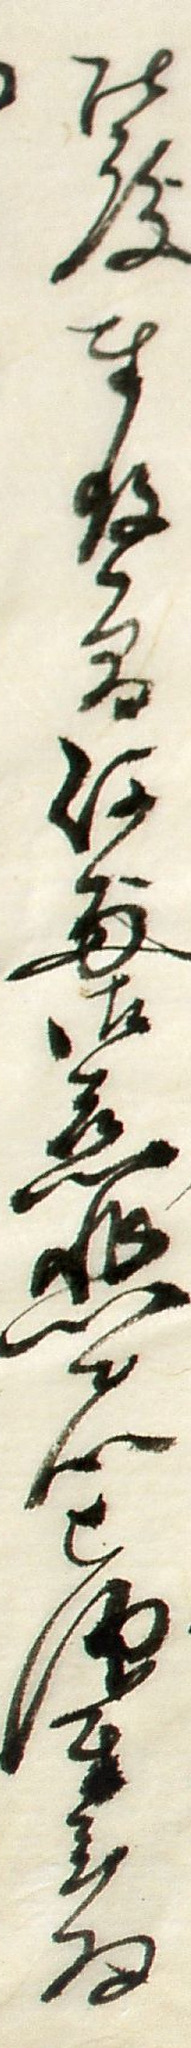仕度奉存候間何卒御慈悲ヲ以被仰付被為
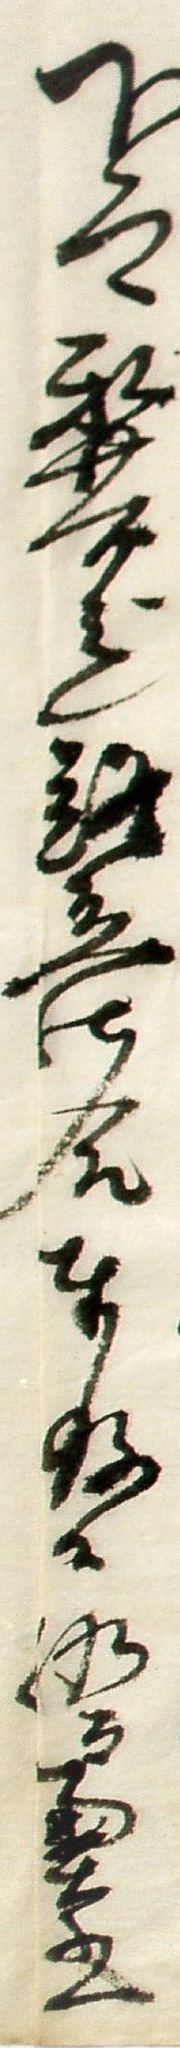下候ハヽ私共迄難有仕合奉存候仍而奥書

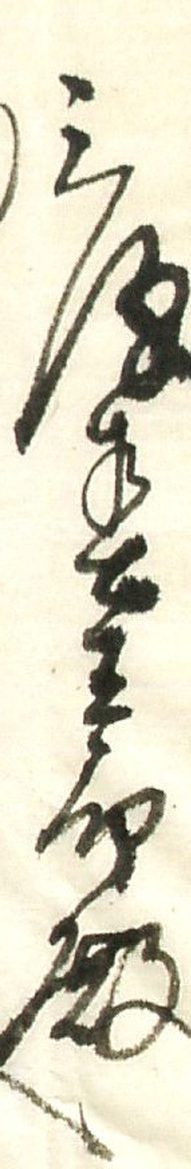三澤春太郎殿
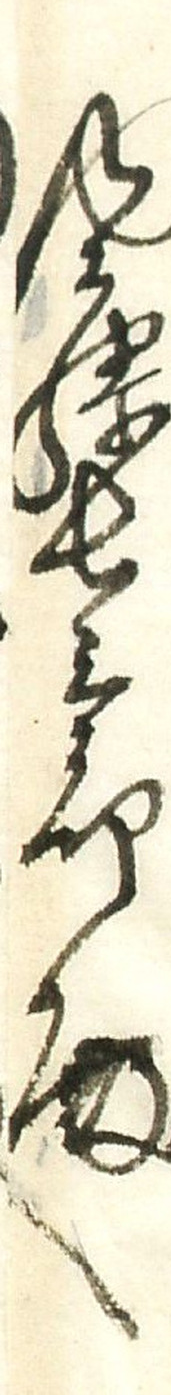内藤長三郎殿
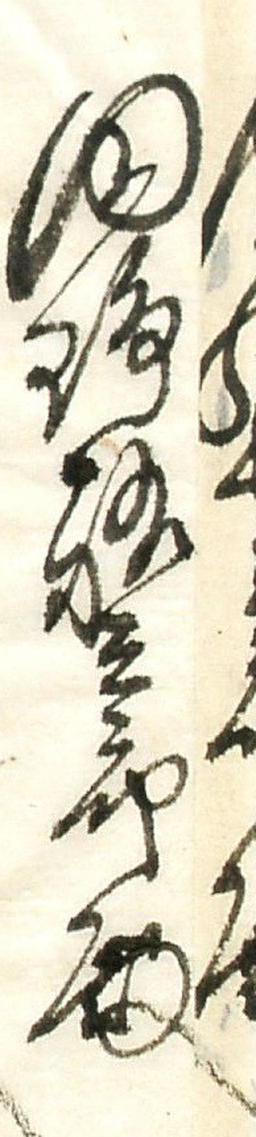田野祐太郎殿
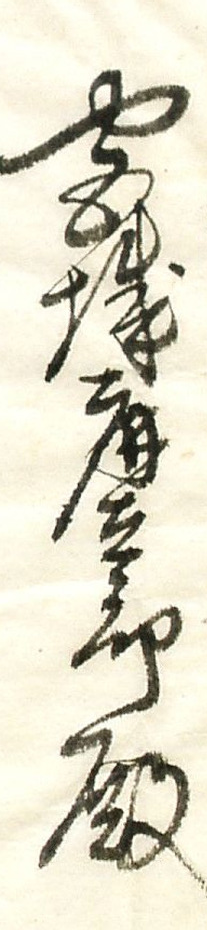宮城麻太郎殿
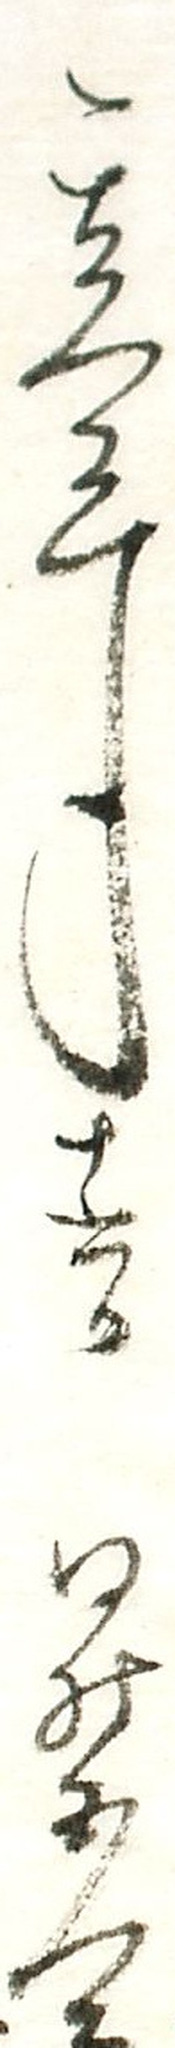亥三月十六日同村五人与
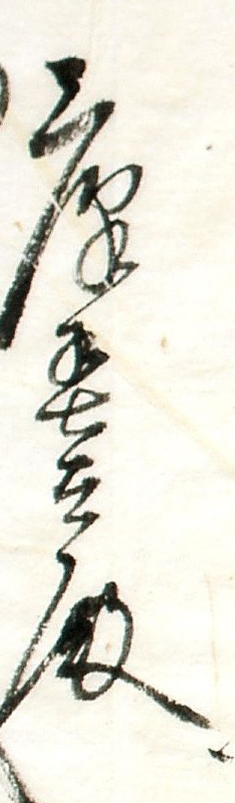三澤春太郎殿
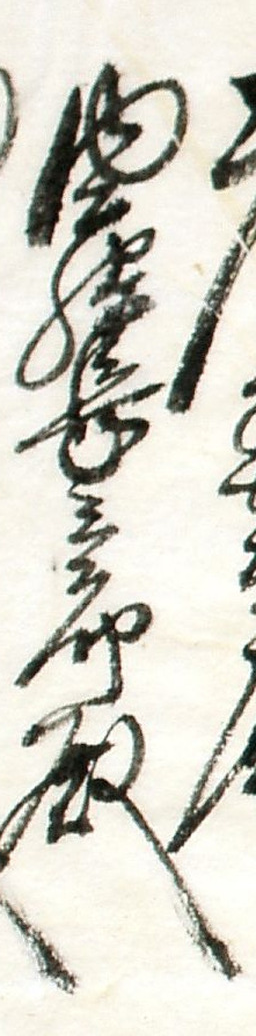内藤長三郎殿
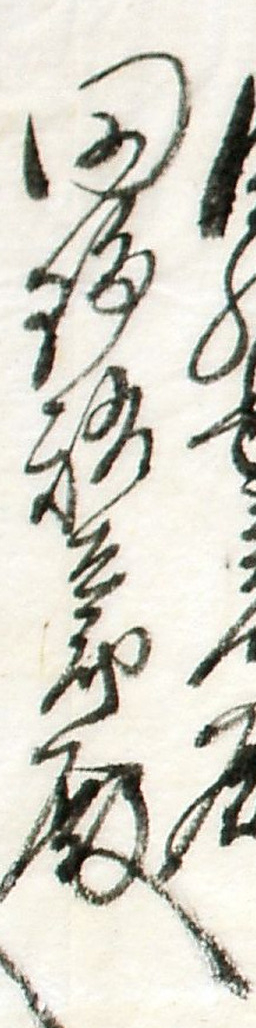田野祐太郎殿
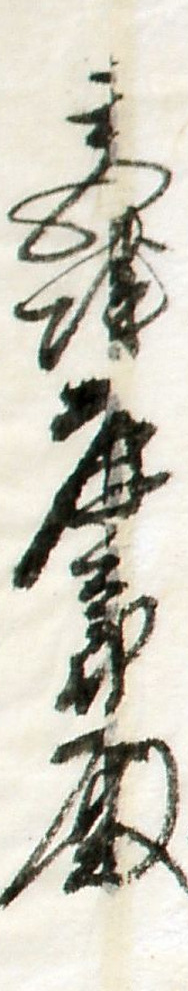宮城麻太郎殿
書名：(早渕村福満寺子ども浄瑠璃願紙面）他
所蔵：鳴門教育大学 Naruto University of Education
